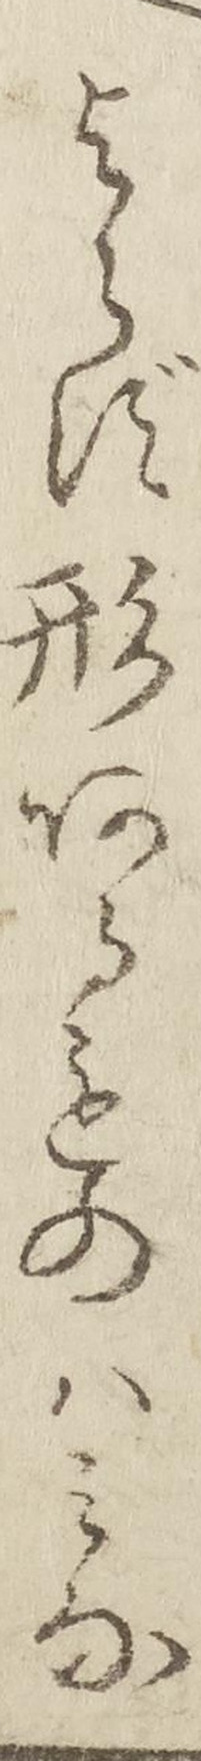よらず形あるものはみな
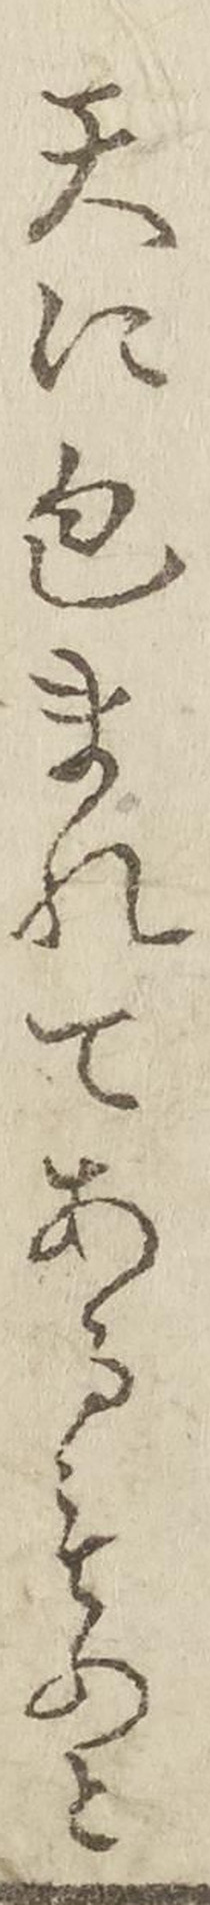天に包まれてあるものと
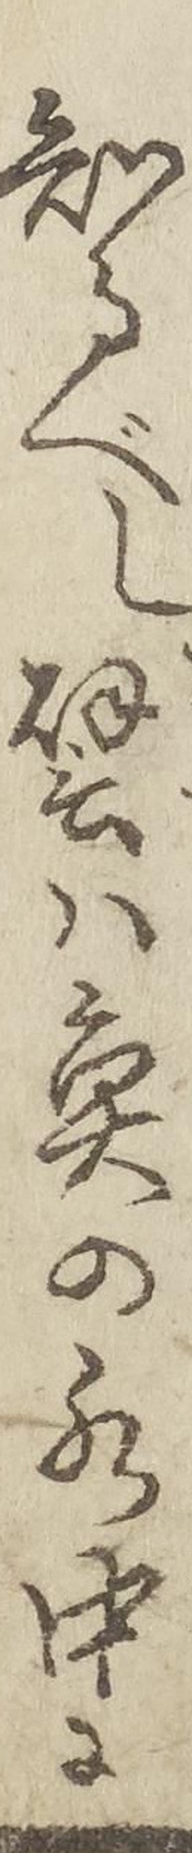知るべし譬は魚の水中に
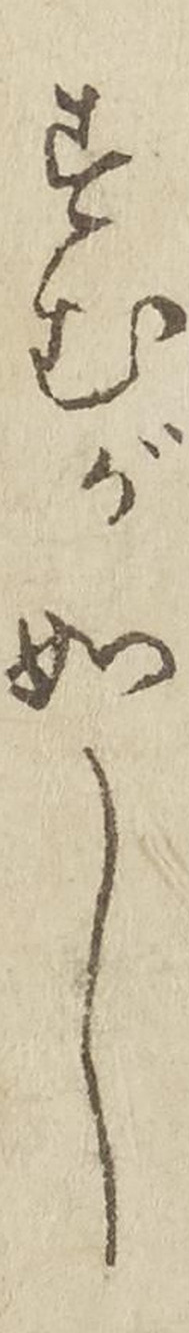すむが如し

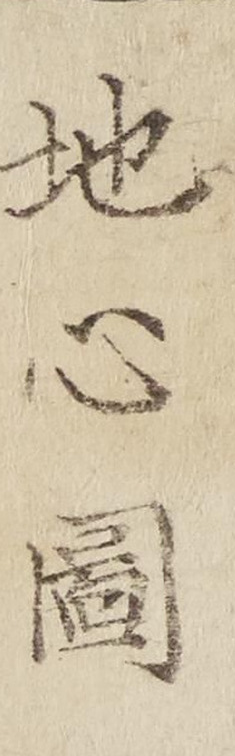地心図
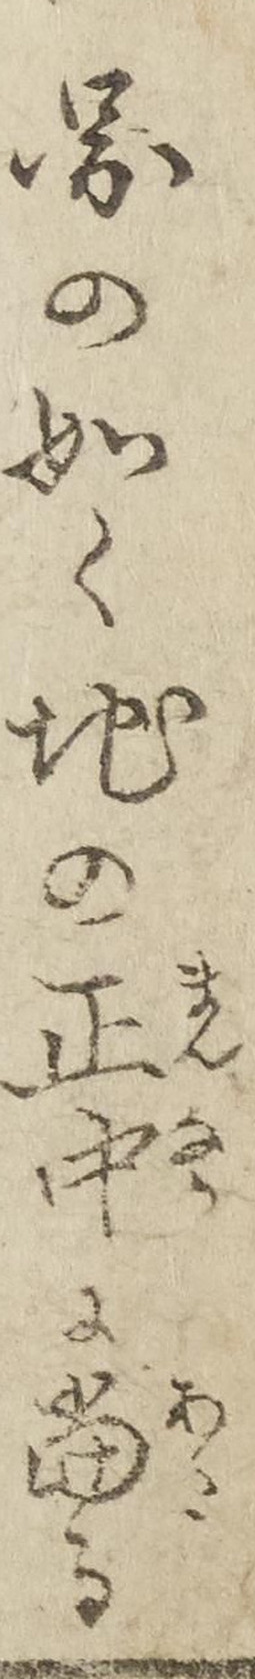図の如く地の正中に当る
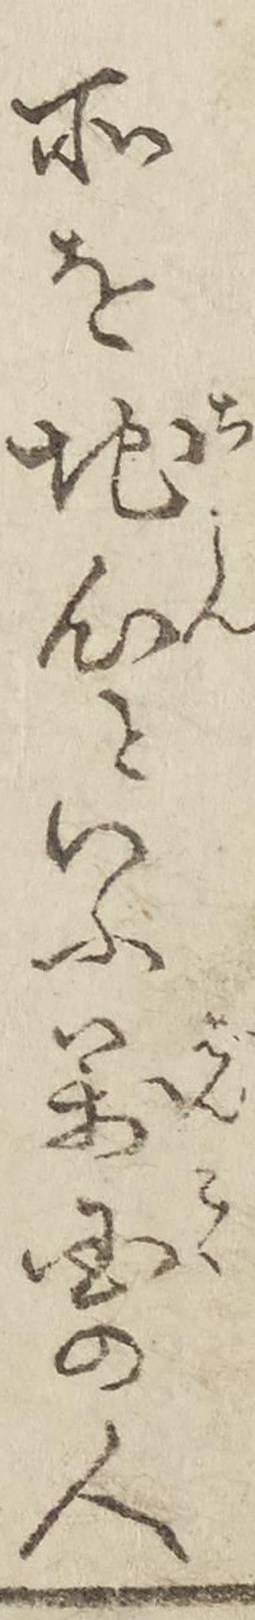所を地心といふ万国の人
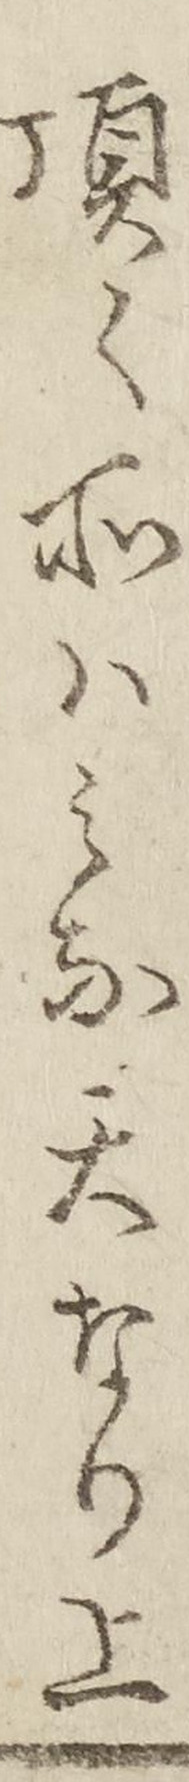頂く所はみな天なり上
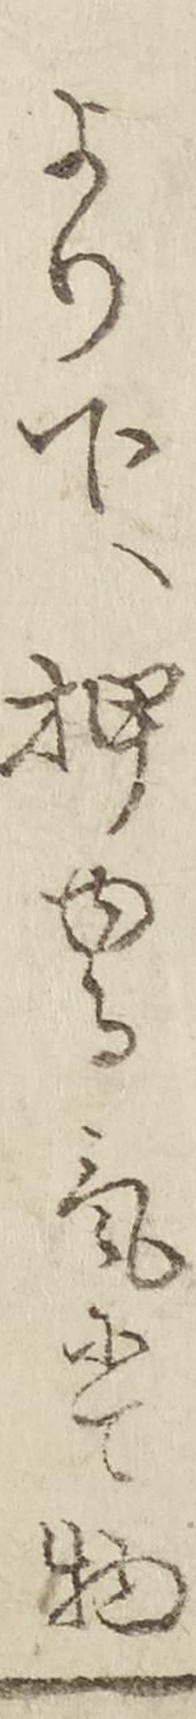より下へ押ゆる気にて物
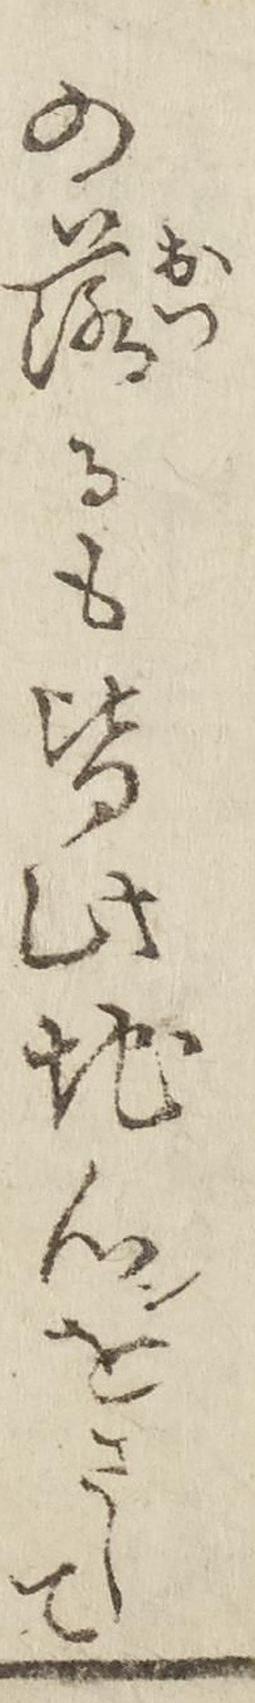の落るも皆此地心
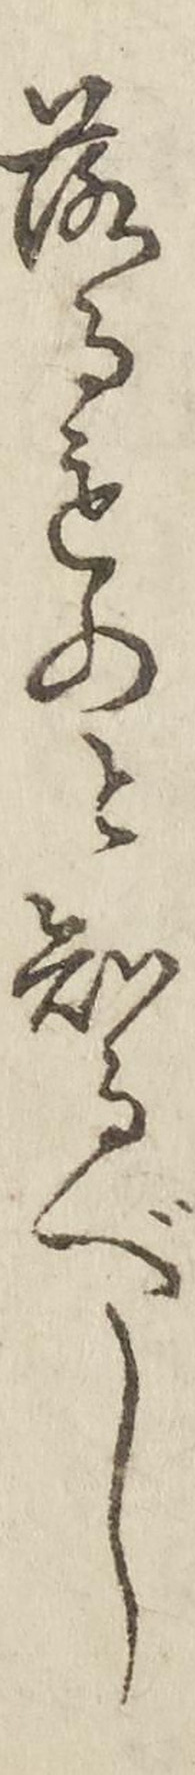落るものと知るべし
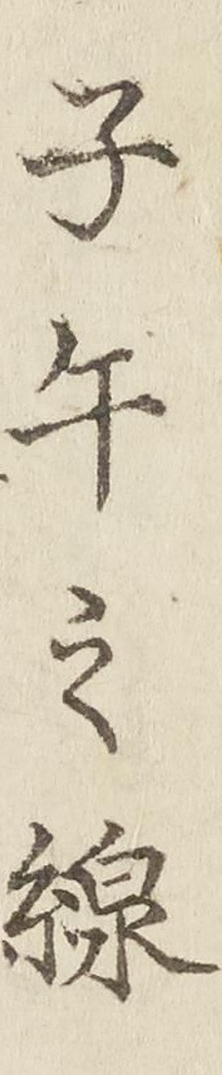子午之線
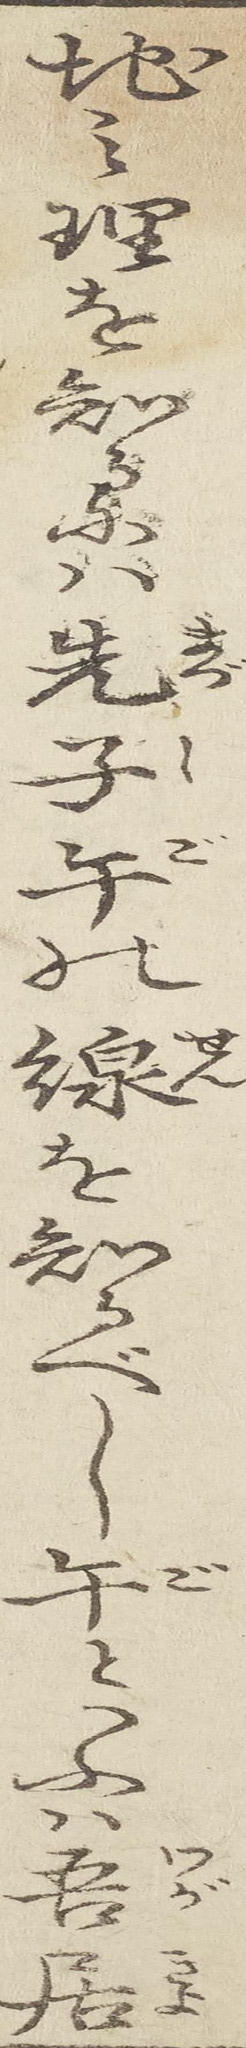地之理を知るには先子午の線を知るべし午といふは吾居
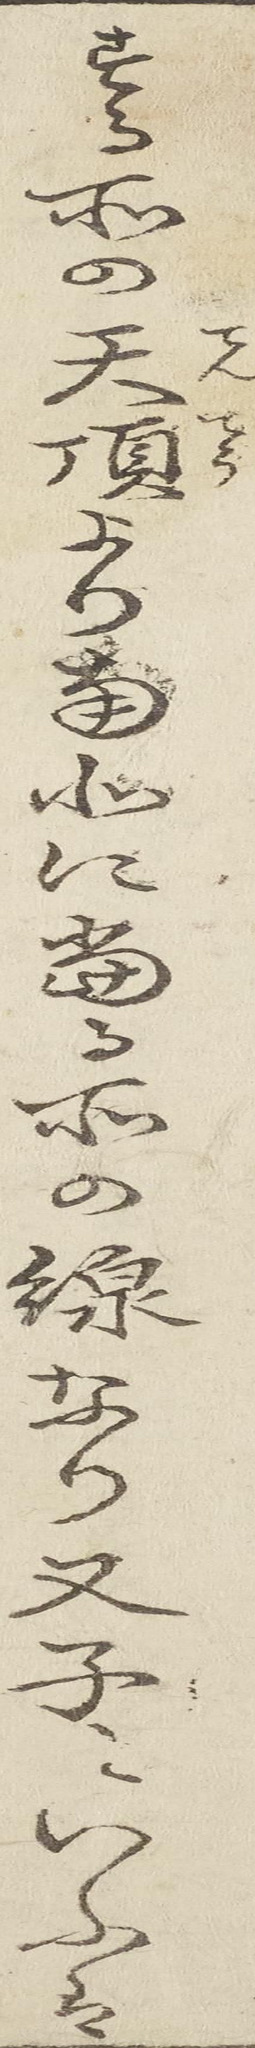する所の天頂より南北に当る所の線なり又子といふは
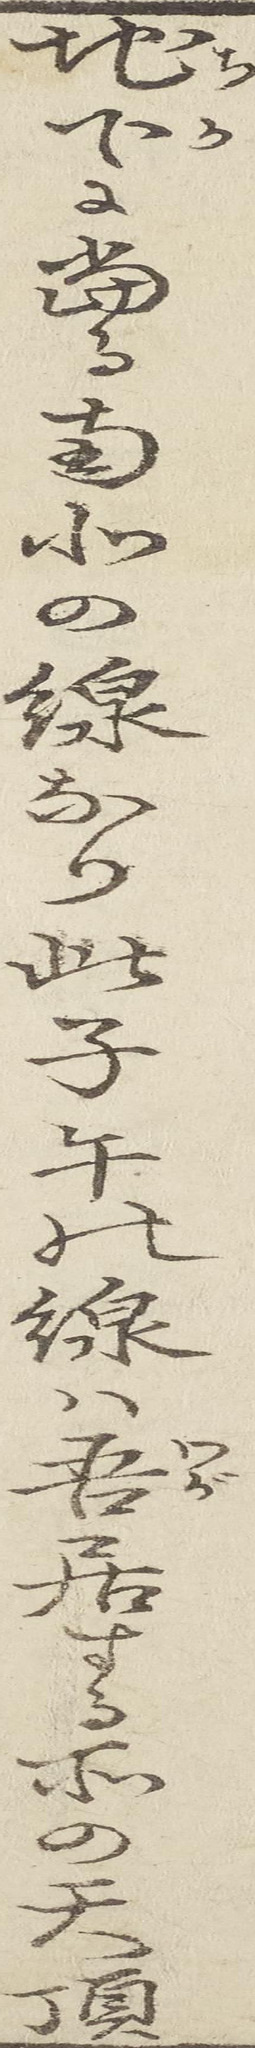地下に当る南北の線なり此子午線は吾居する所の天頂
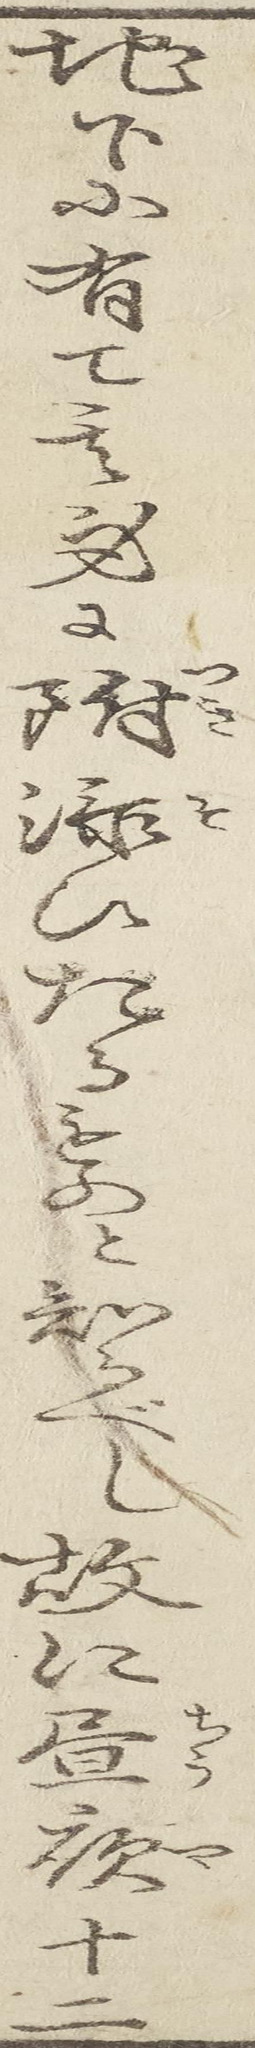地下に有て其身に附添ひたるものと知るべし故に昼夜十二
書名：平天儀圖解
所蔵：東京大学地震研究所図書室 Earthquake Research Institute Library, The University of Tokyo, JAPAN
